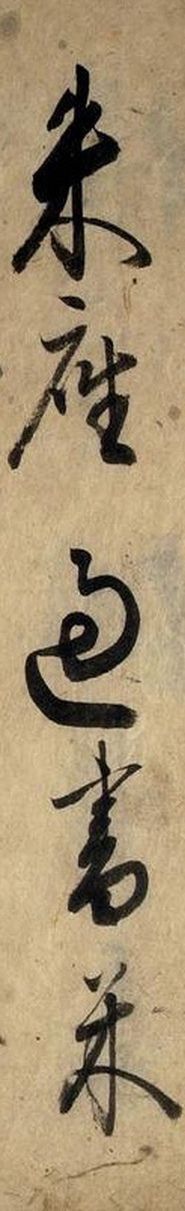米座過書米
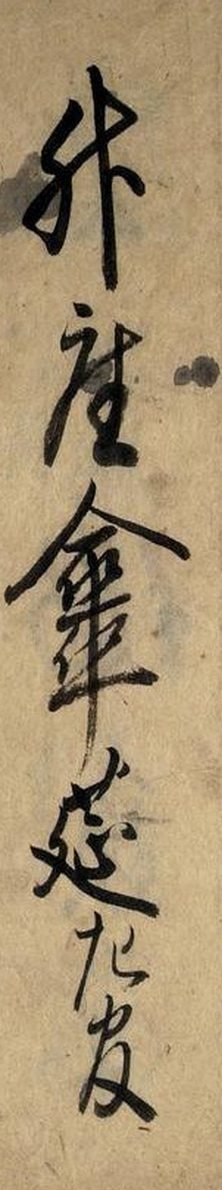升座傘莚左官
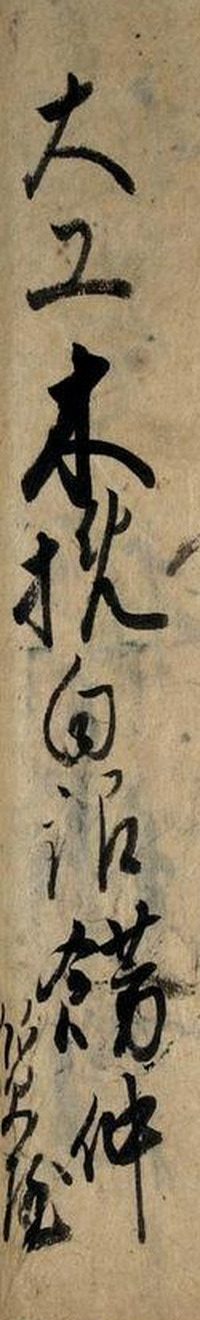大工木挽白銀飾仲
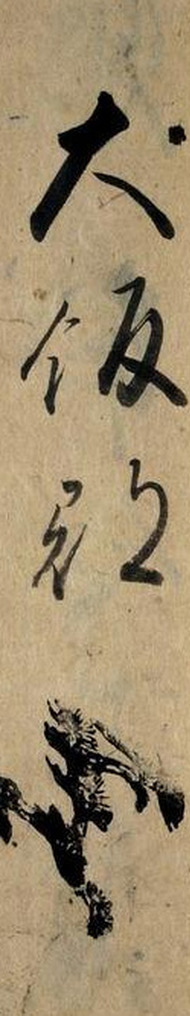大飯郡
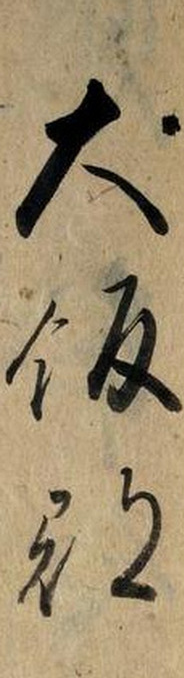大飯郡
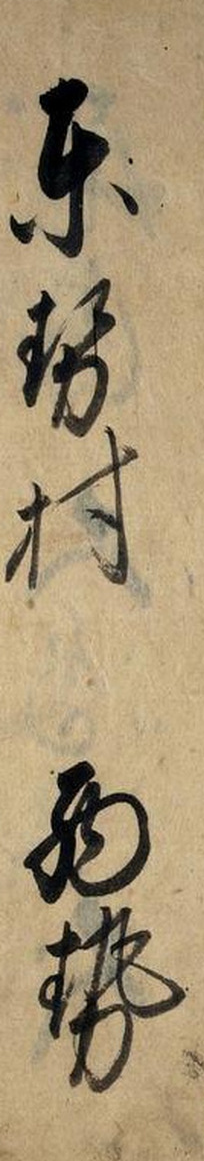東勢村西勢
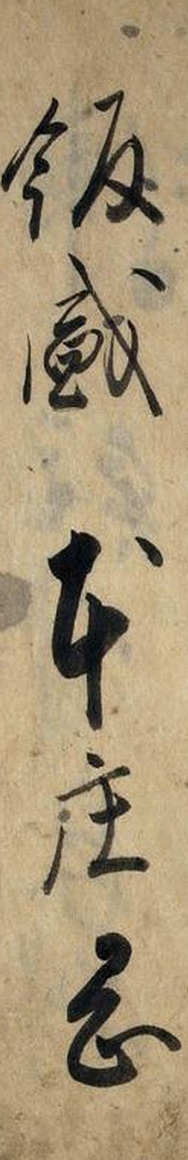飯盛本庄岡

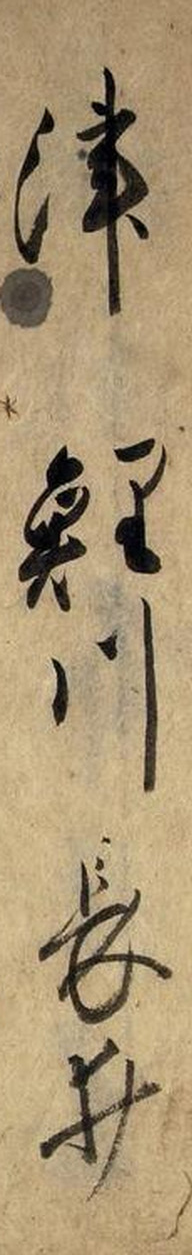津鯉川長井
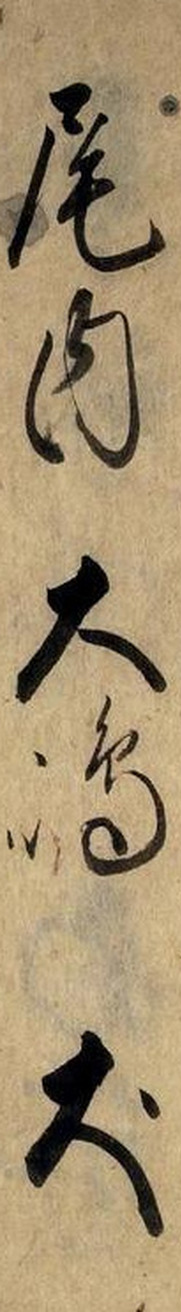尾内大嶋犬
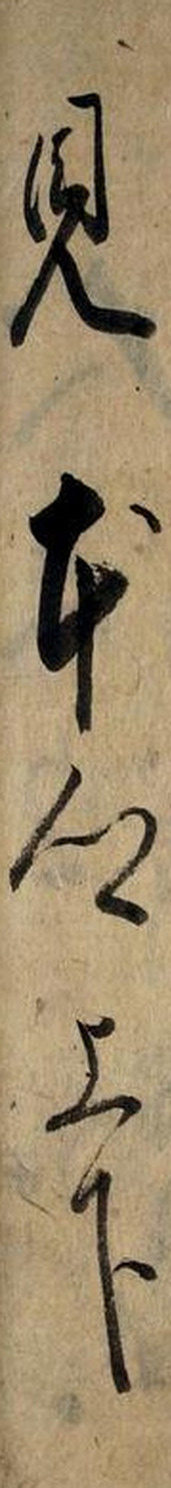見本郷上下
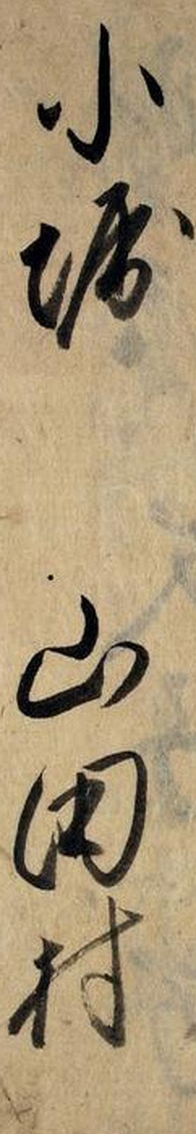小堀山田村
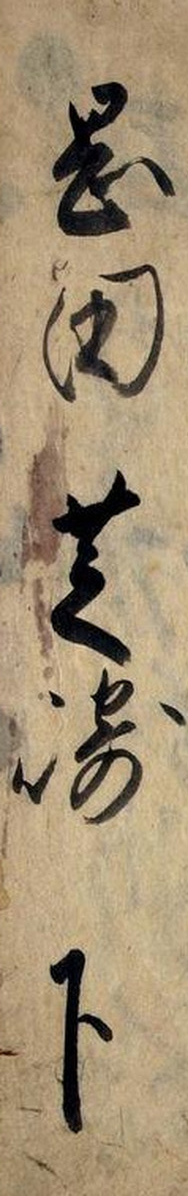岡田芝崎下

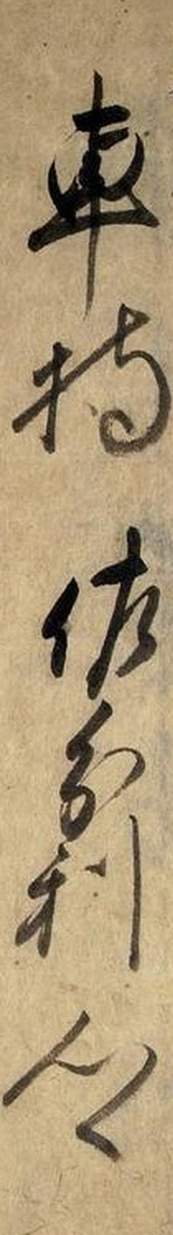車持佐分利郷
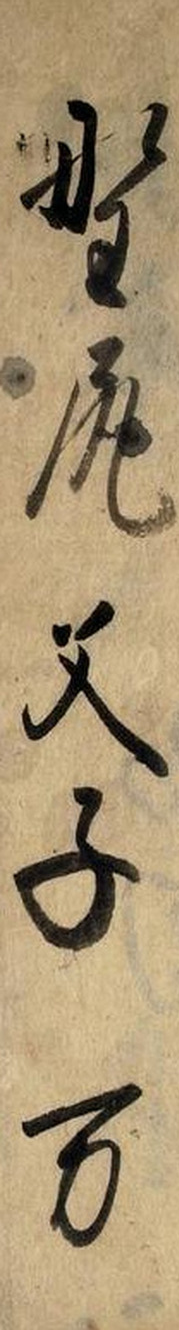野尻父子万
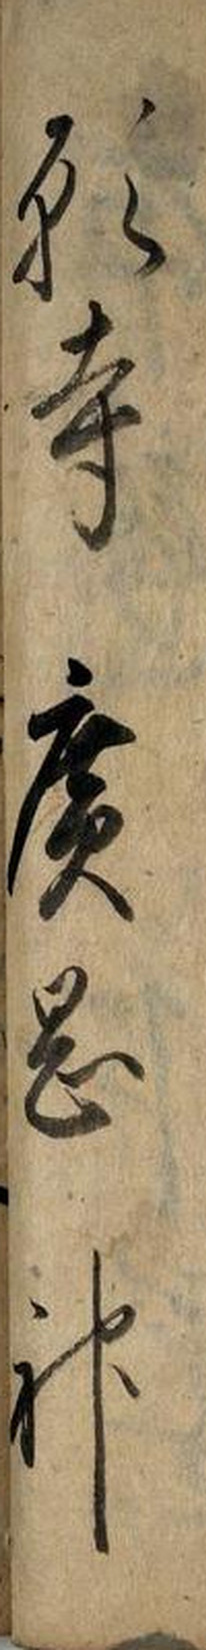願寺広岡神
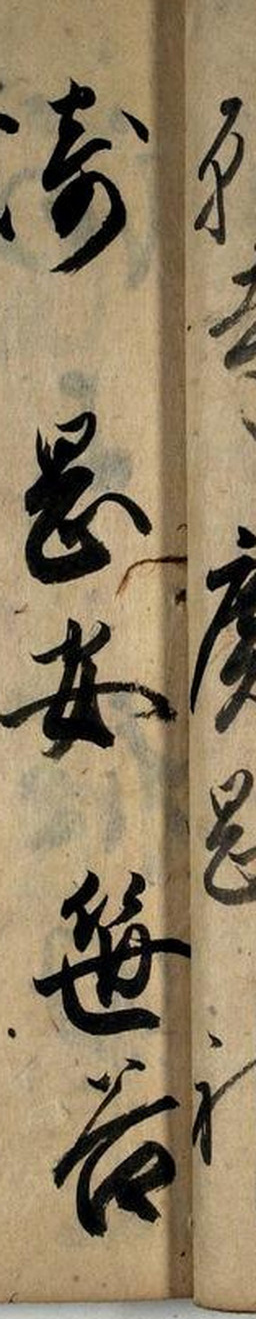崎岡安笹谷
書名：御手本（手習、家号之事、小浜商家の屋号）
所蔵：福井県文書館 Fukui Prefectural Archives
